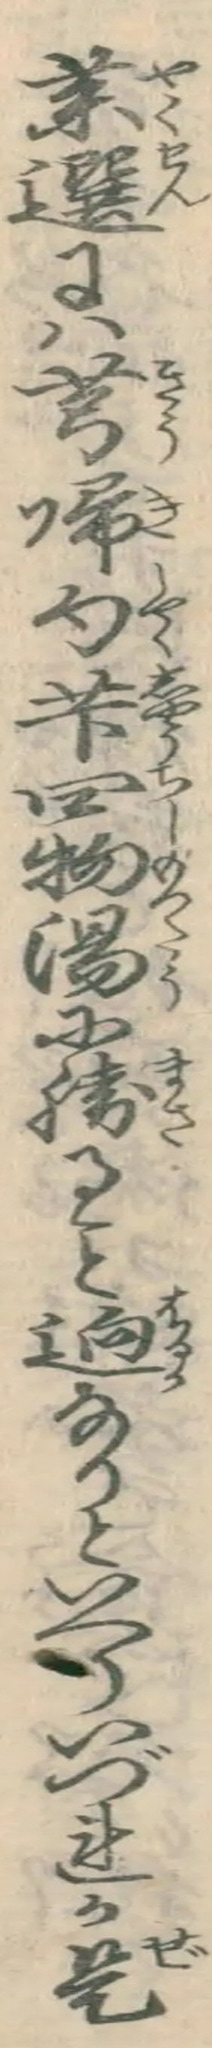薬選には芎帰勺芐四物湯に勝ること逈なりといへりいづれか是

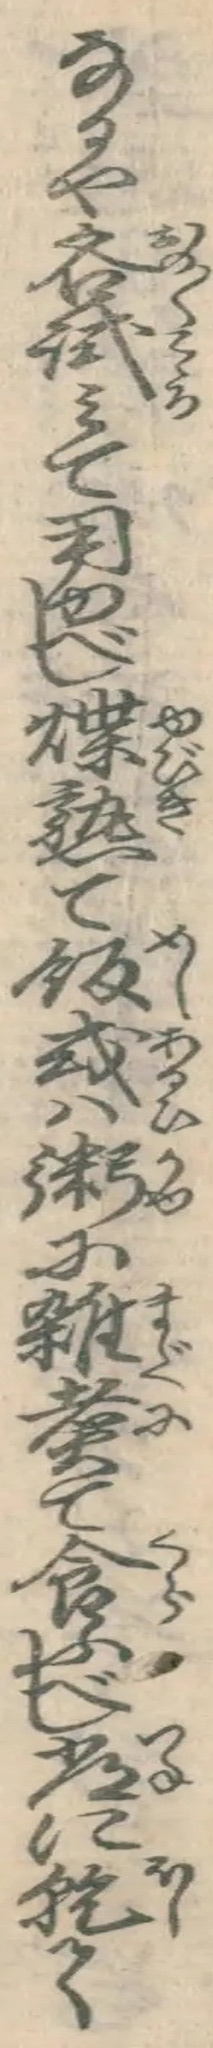なるや各試みて用ゆべし煠熟て飯或は粥に雑煑て食ふべし常に乾て
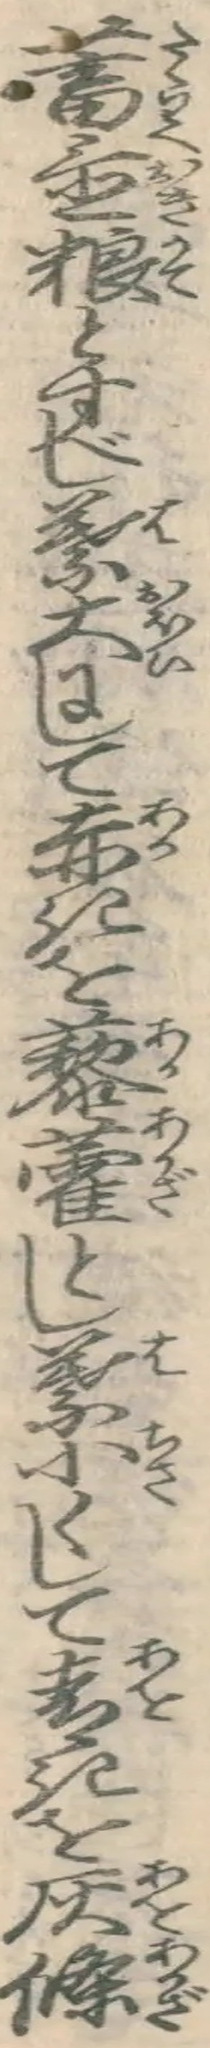蓄置粮とすべし葉大にして赤きを藜藿とし葉小くして青きを灰條
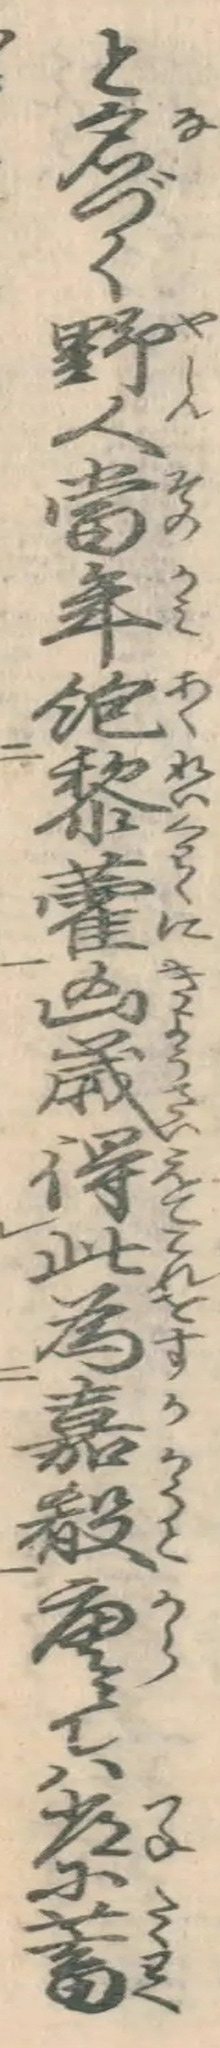と名づく野人当年飽黎藿凶歳得此為嘉殽唐にては常に蓄
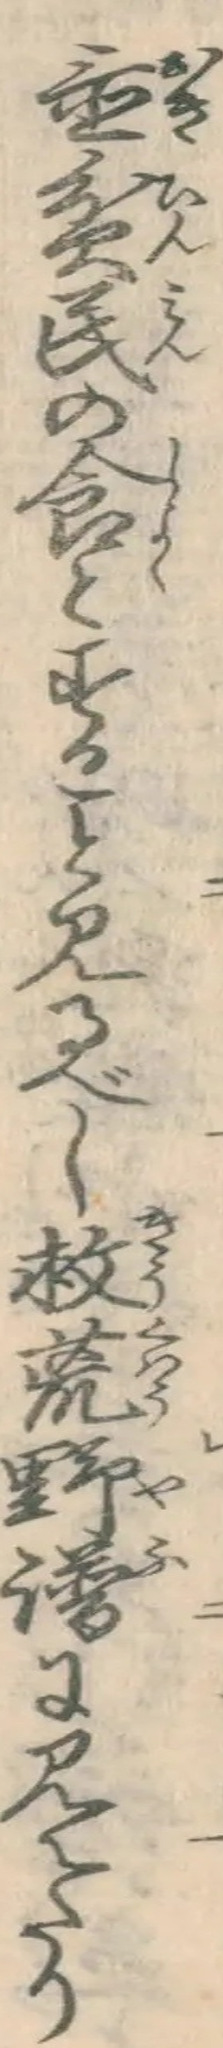置貧民の食とすること見るべし救荒野譜に見えたり
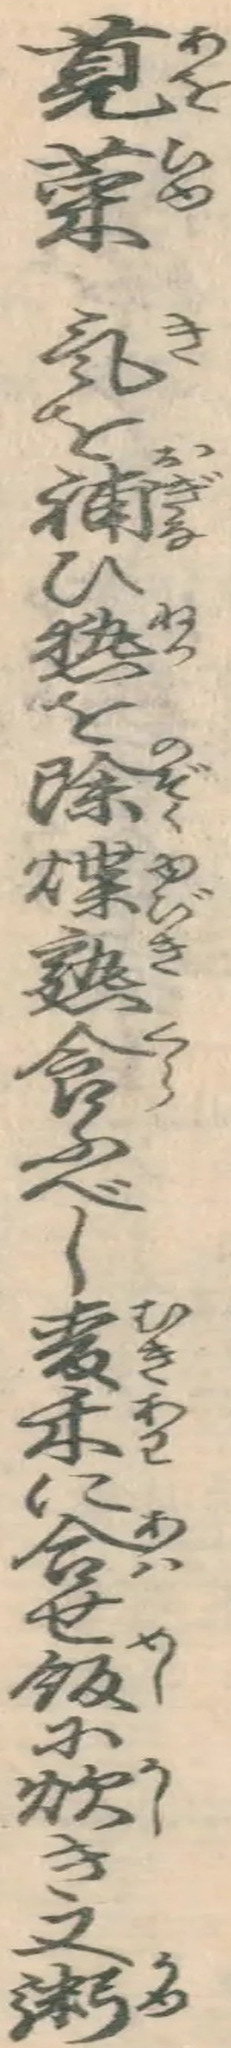莧菜気を補ひ熱を除煠熟食ふべし麦禾に合せ飯に炊き又粥
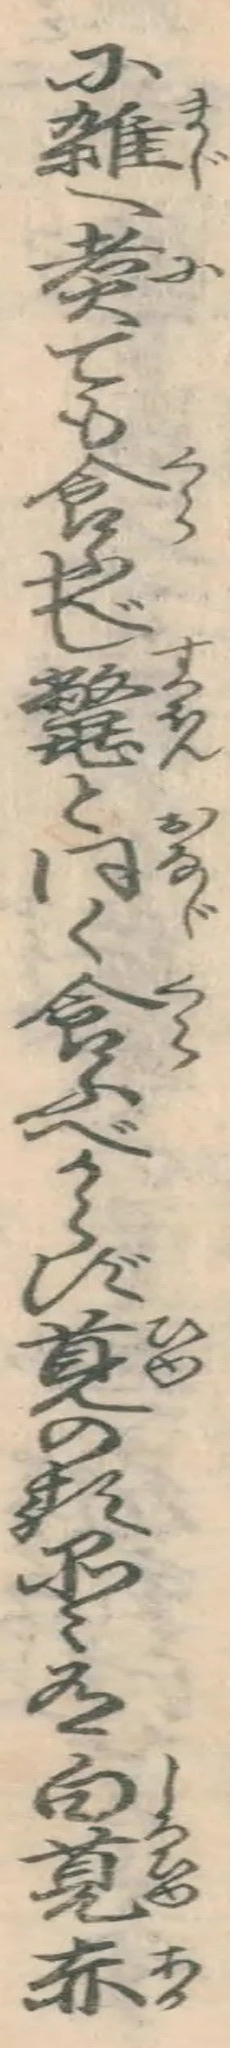に雑へ煑ても食ふべし鼈と同く食ふべからず莧の類品々有白莧赤
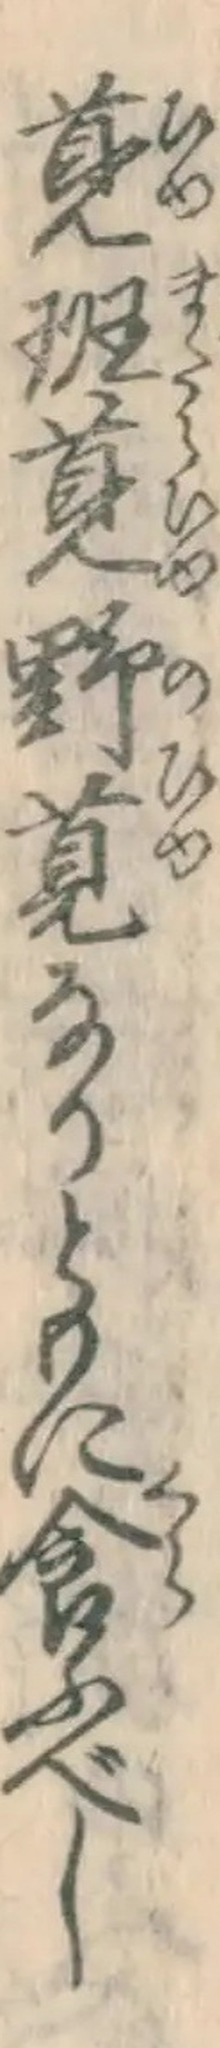莧斑莧野莧なりともに食ふべし
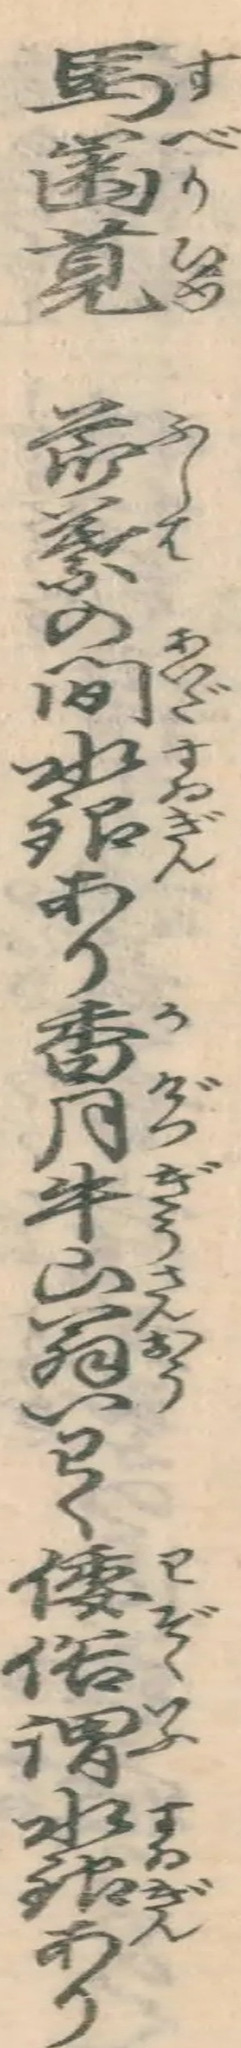馬歯莧節葉の間水銀あり香月牛山翁いわく倭俗謂水銀あり
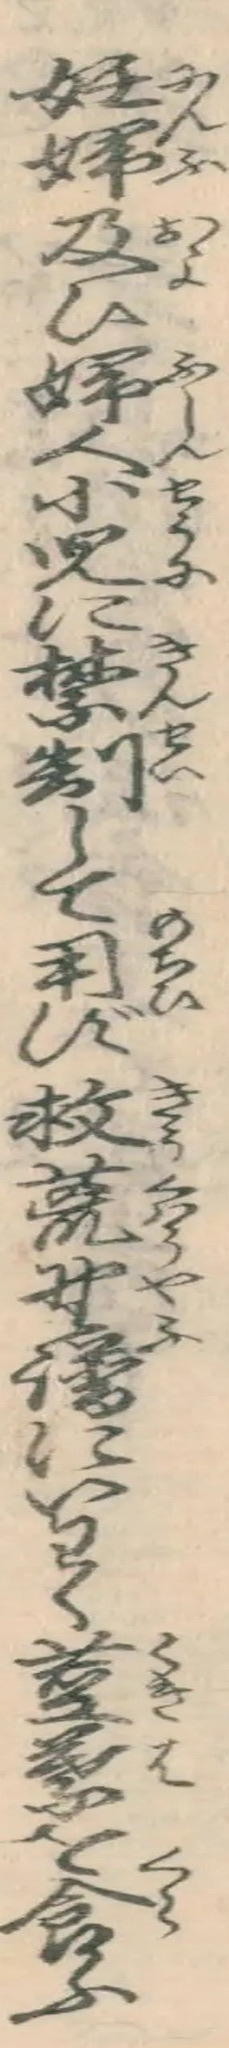妊婦及ひ婦人小児に禁制して用ず救荒野譜にいわく茎葉を食ふ
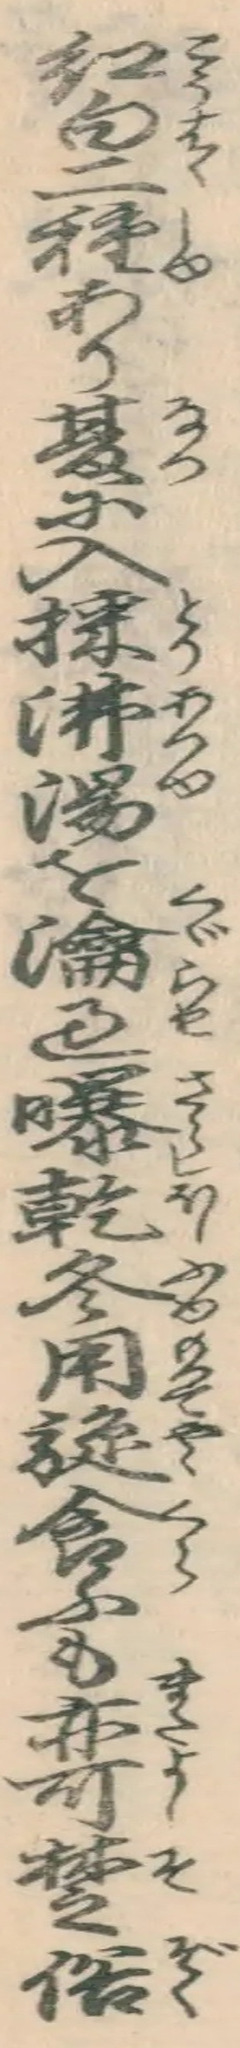紅白二種あり夏に入採沸湯を瀹過曝乾冬用旋食ふも亦可楚俗
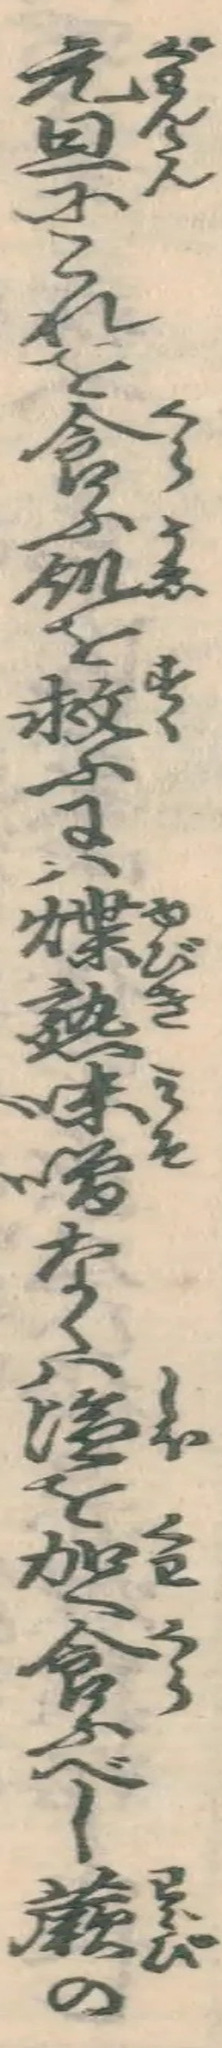元旦にこれを食ふ飢を救ふには煠熟味噌なくは塩を加へ食ふべし蕨の
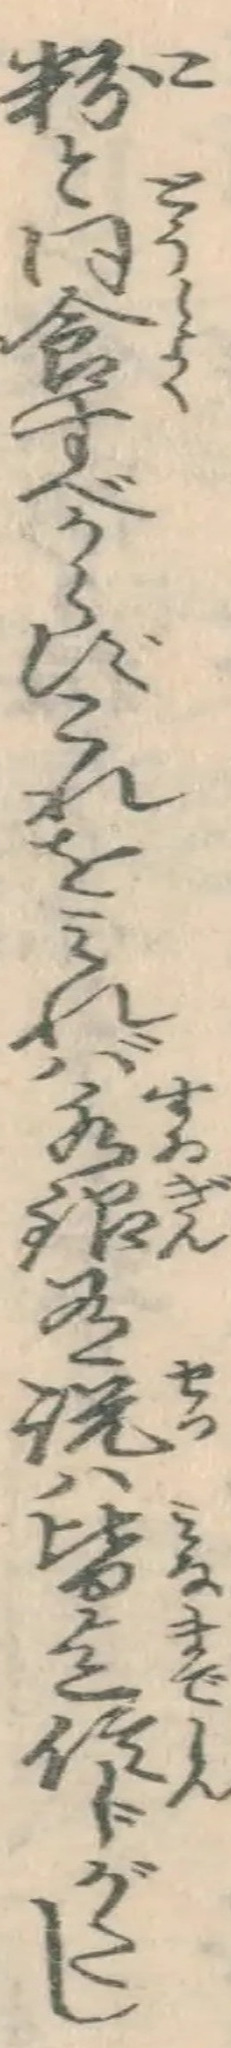粉と同食すべからずこれをみれば水銀有説は皆迠信じがたし
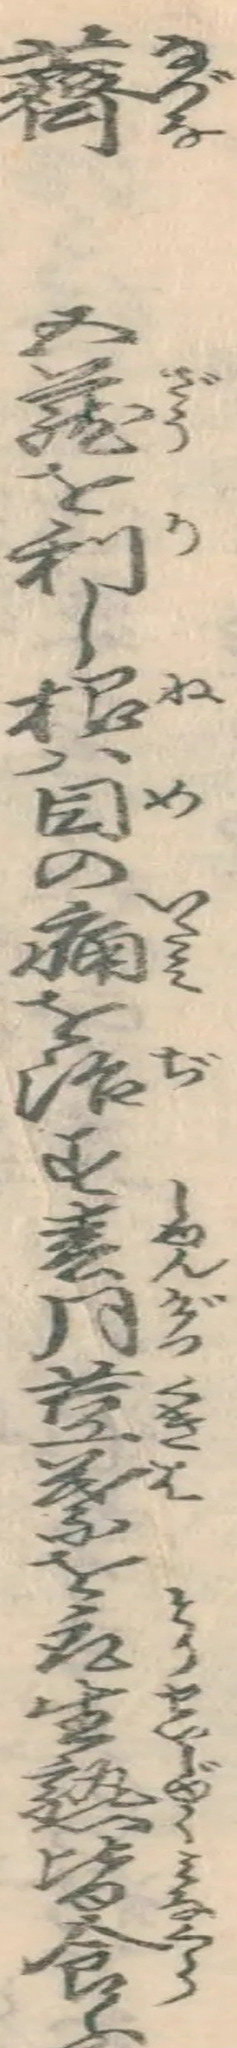萕五蔵を利し根は目の痛を治す春月茎葉を取生熟皆食ふ
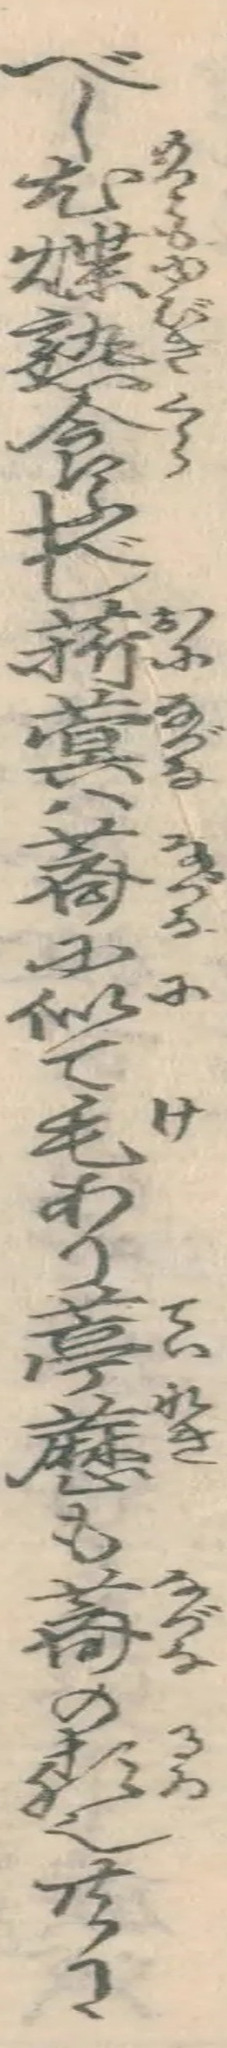べし尤煠熟食ふべし菥蓂は萕に似て毛あり葶藶も薺の類也共に
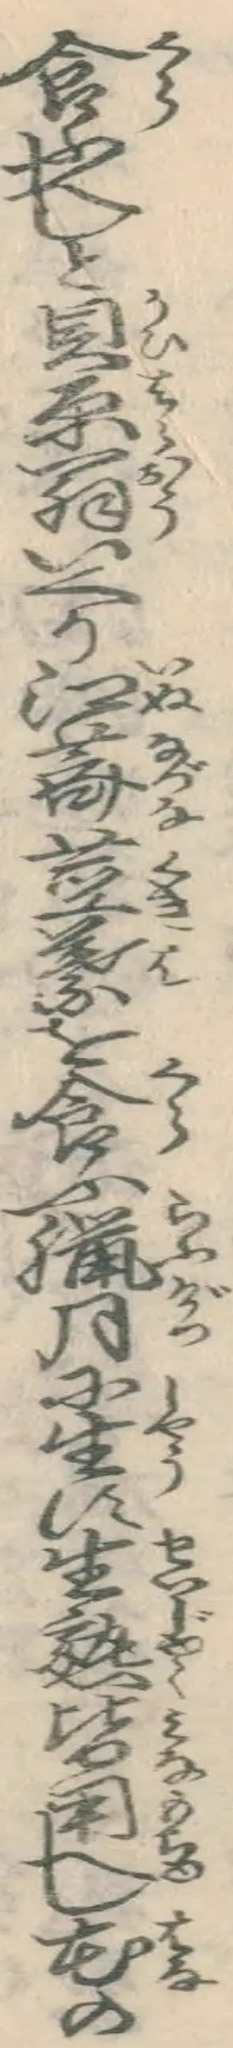食ふへしと貝原翁いへり江薺茎葉を食ふ臘月に生す生熟皆用へし花の
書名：経済をしへ草
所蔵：国立国会図書館 National Diet Library, JAPAN
